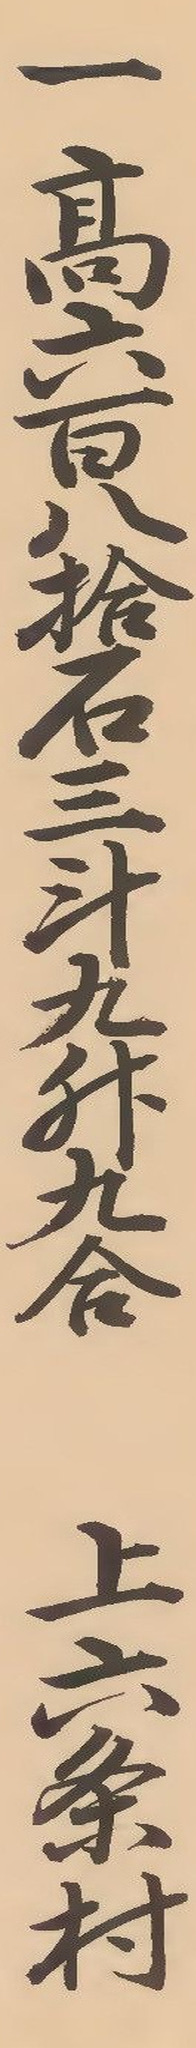一高六百八拾石三斗九升九合上六条村
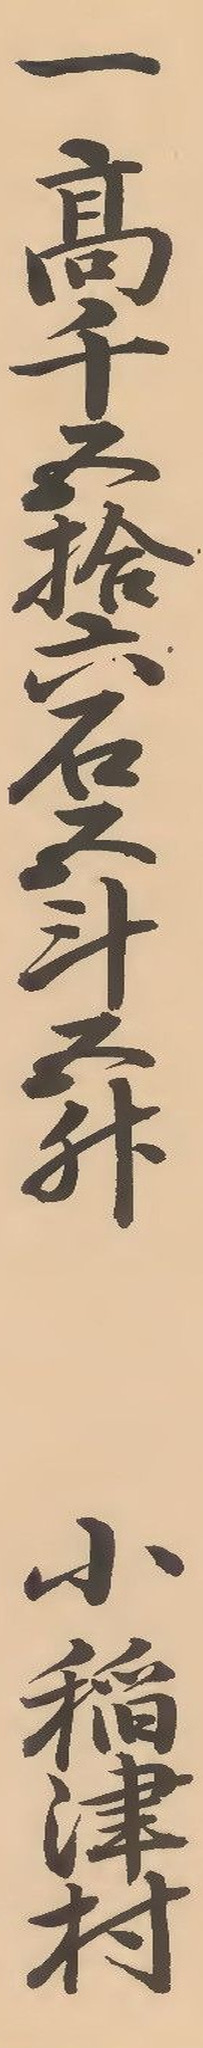一高千五拾六石五斗五升小稲津村
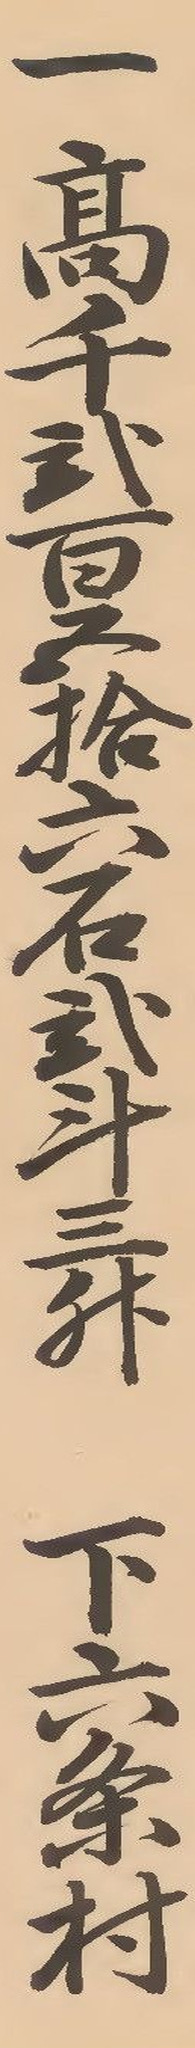一高千弐百五拾六石弐斗三升下六条村
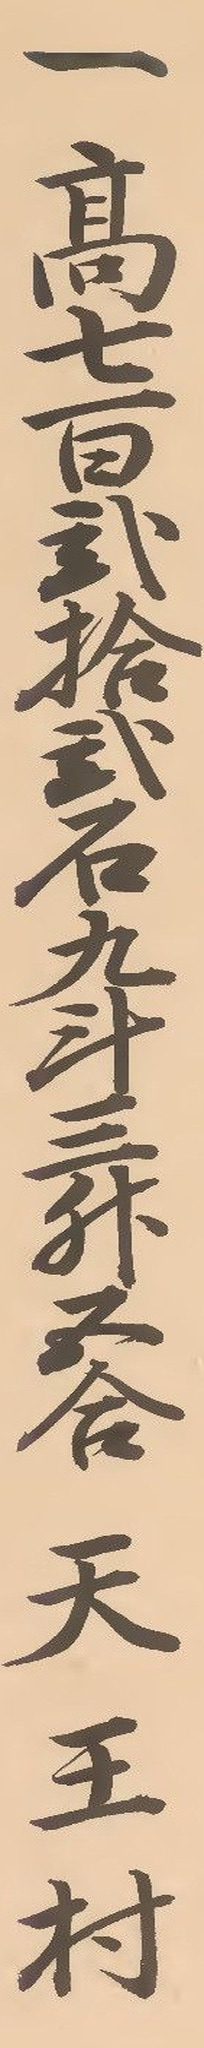一高七百弐拾弐石九斗三升五合天王村
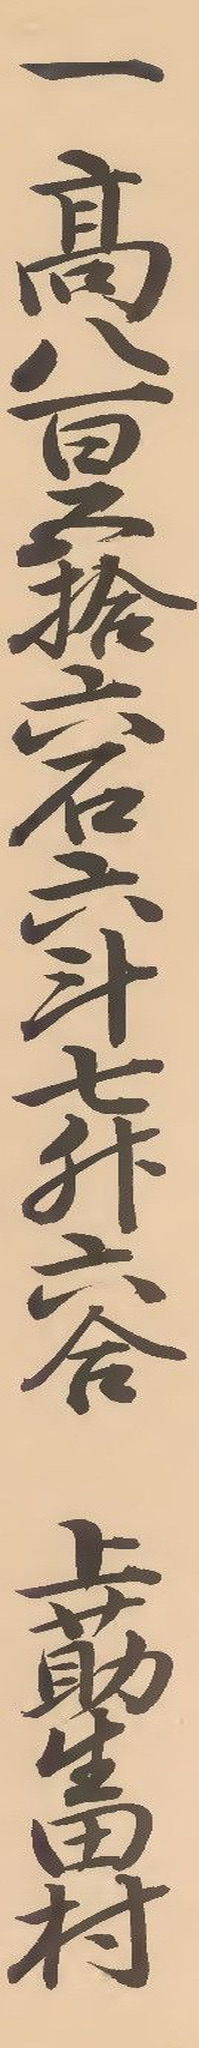一高八百五拾六石六斗七升六合上莇生田村
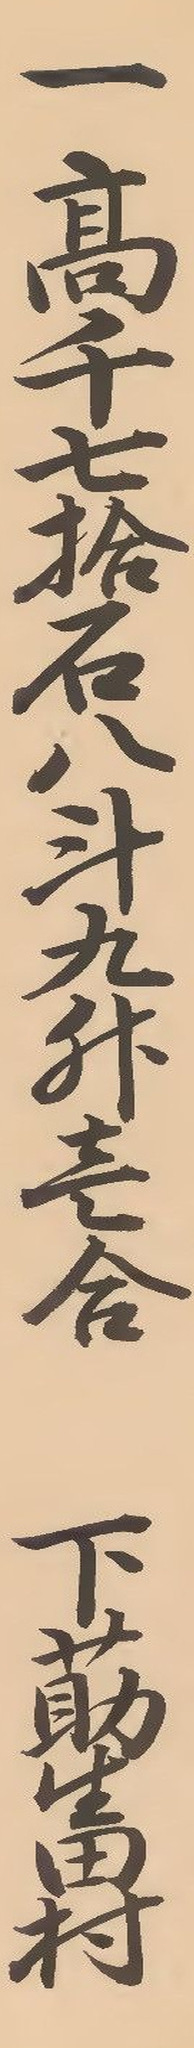一高千七拾石八斗九升壱合下莇生田村
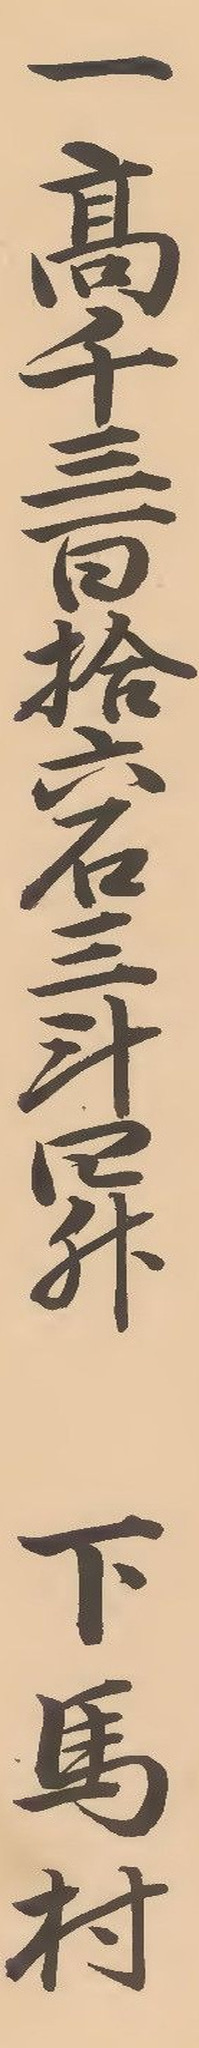一高千三百拾六石三斗四升下馬村

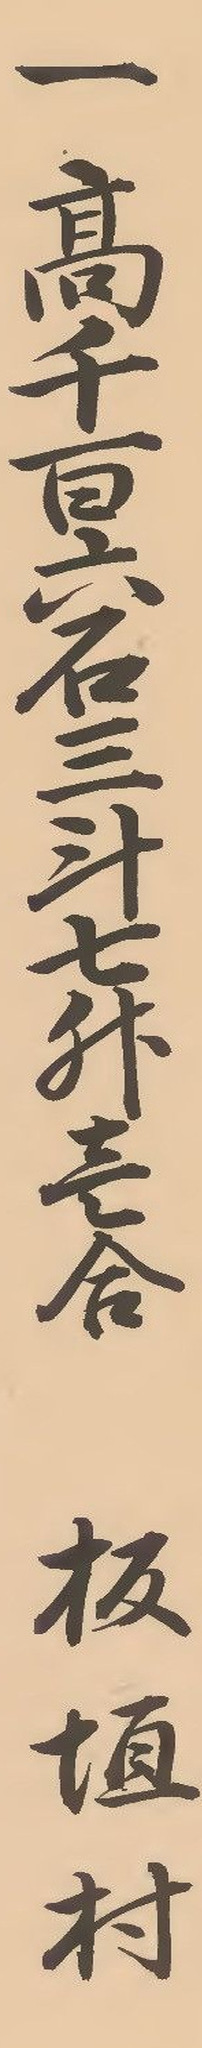一高千百六石三斗七升壱合板垣村
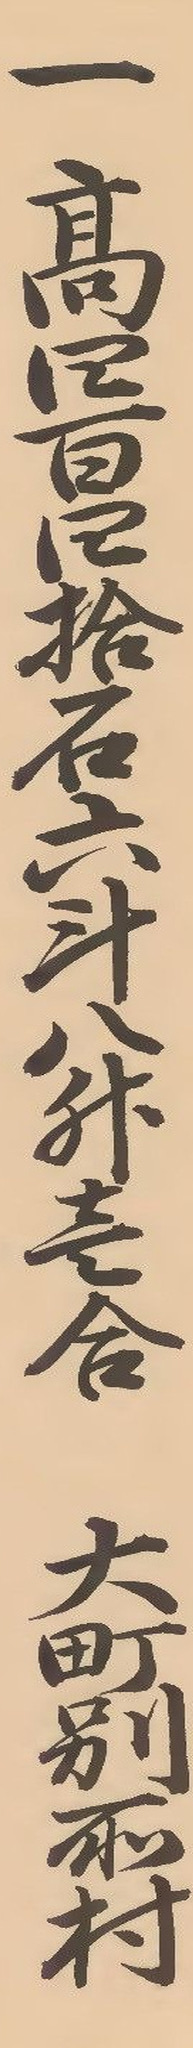一高四百四拾石六斗八升壱合大町別所村
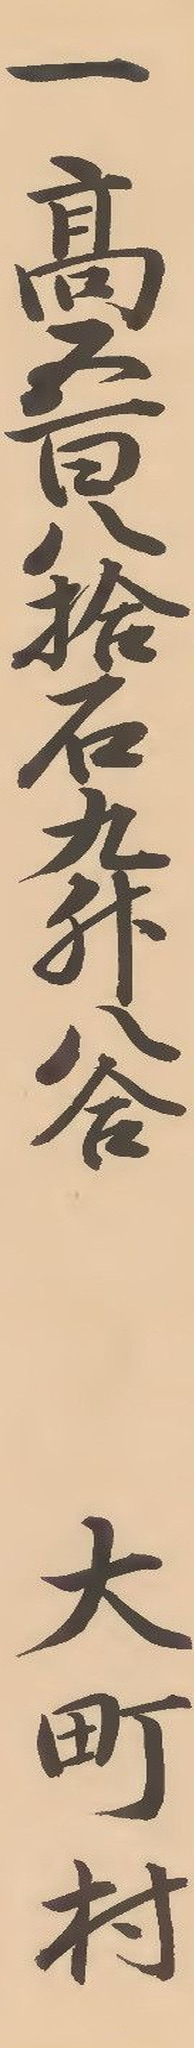一高五百八拾石九升八合大町村
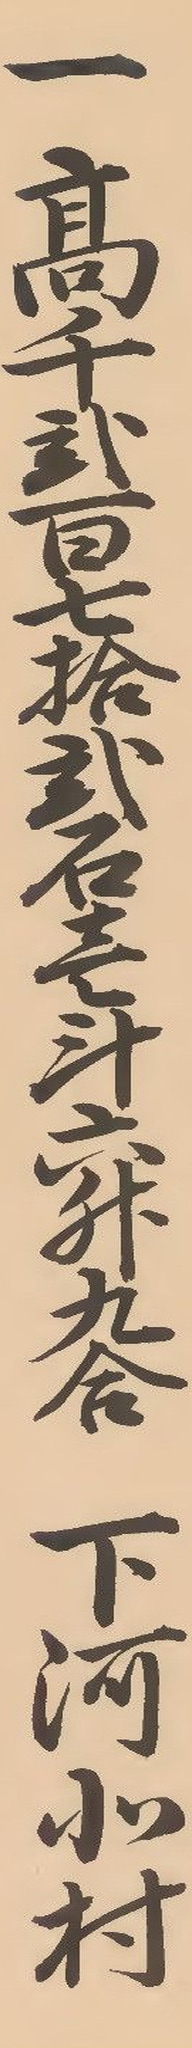一高千弐百七拾弐石壱斗六升九合下河北村
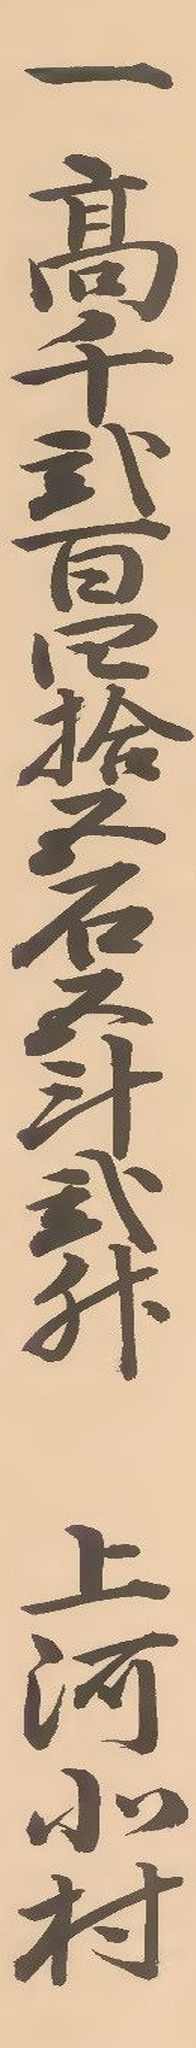一高千弐百四拾五石五斗弐升上河北村
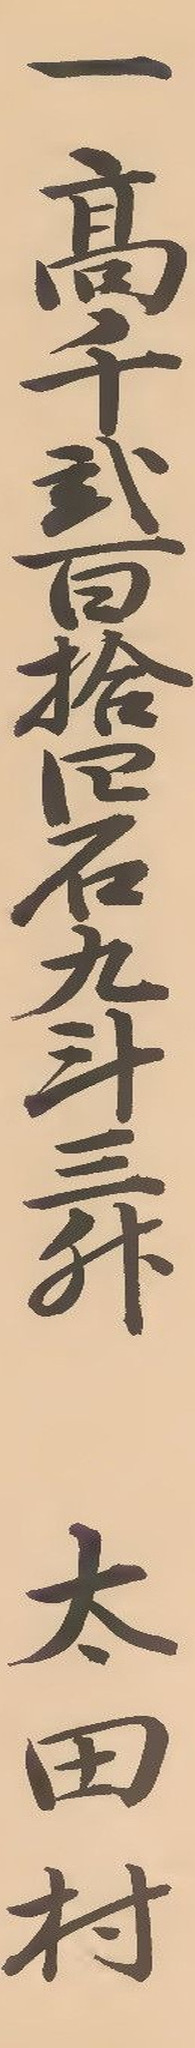一高千弐百拾四石九斗三升太田村
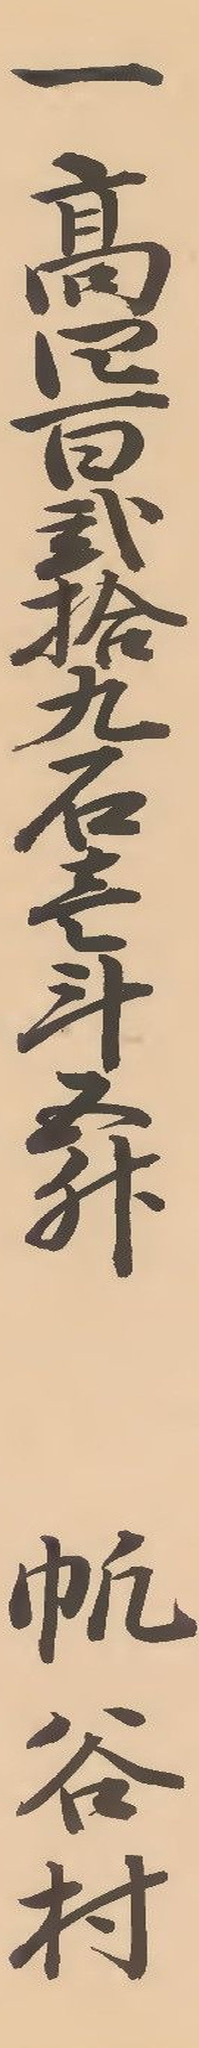一高四百弐拾九石壱斗五升帆谷村
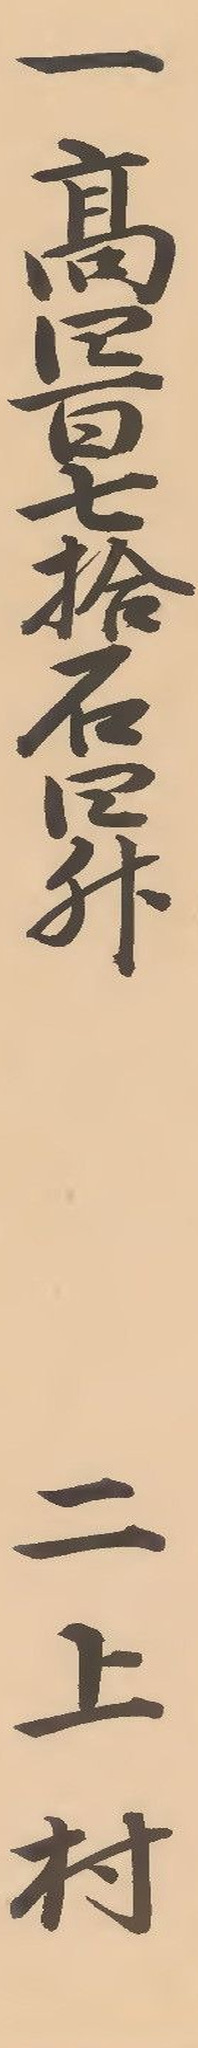一高四百七拾石四升二上村

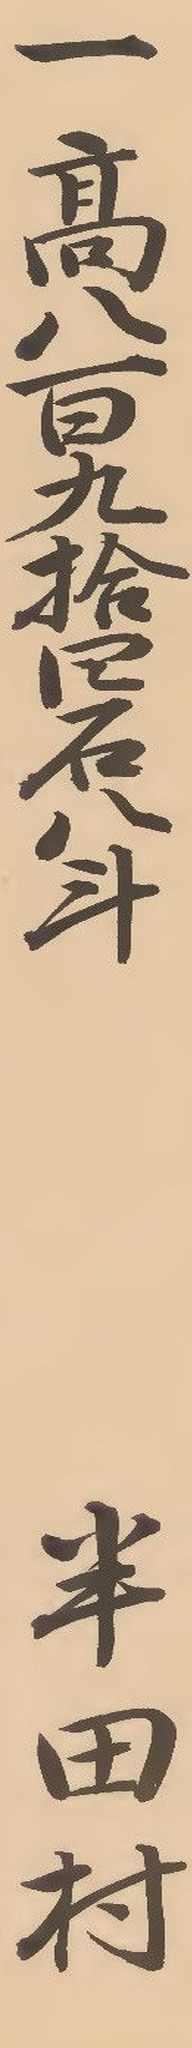一高八百九拾四石八斗半田村
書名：越前国郷帳
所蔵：国立公文書館 National Archives of Japan
